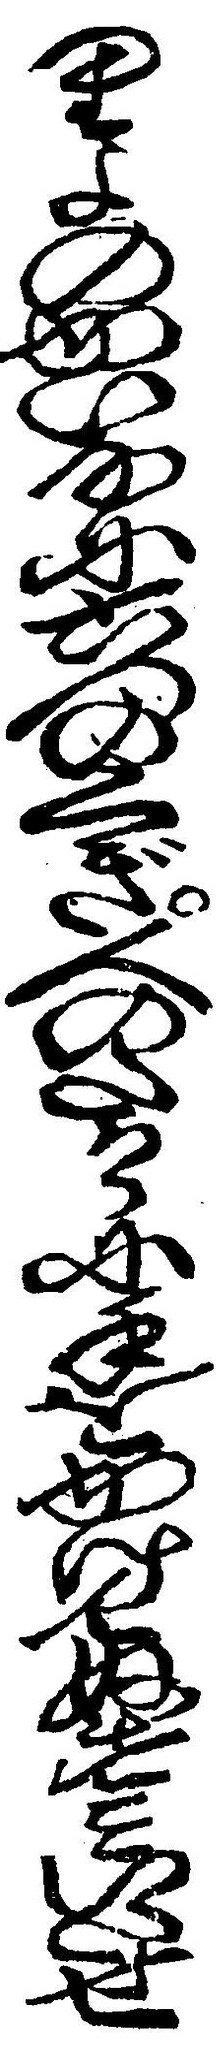りよのかいなに六つのくぎ。人のたからに手をかけてぬすみいたせ
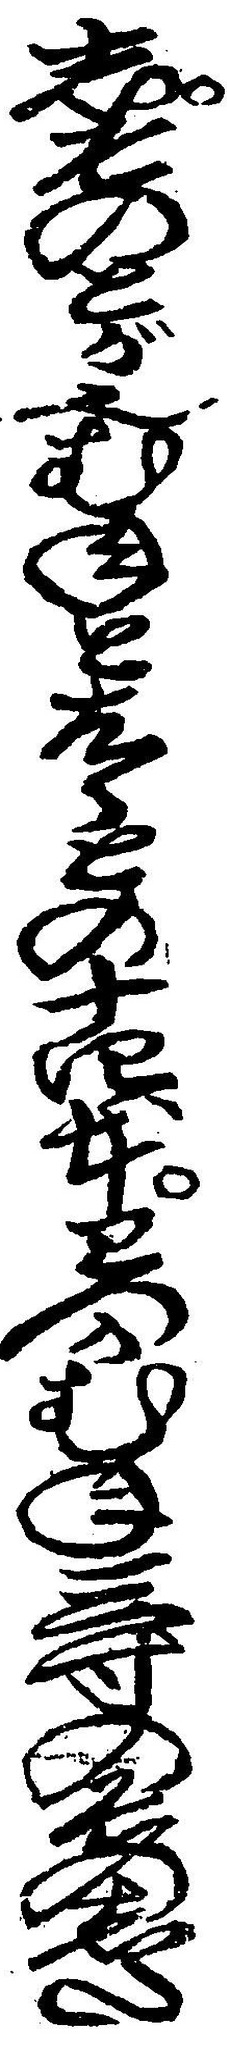し。そのとが也むねとはらとの十四本。わつかむね三寸のそのした
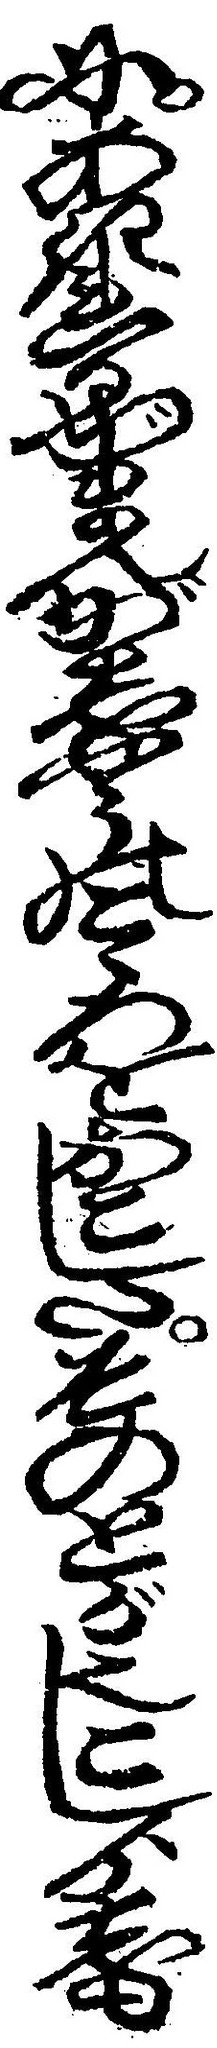に。あきれるぢまんがしやうの心をおこした。そのとが也こしゟしも
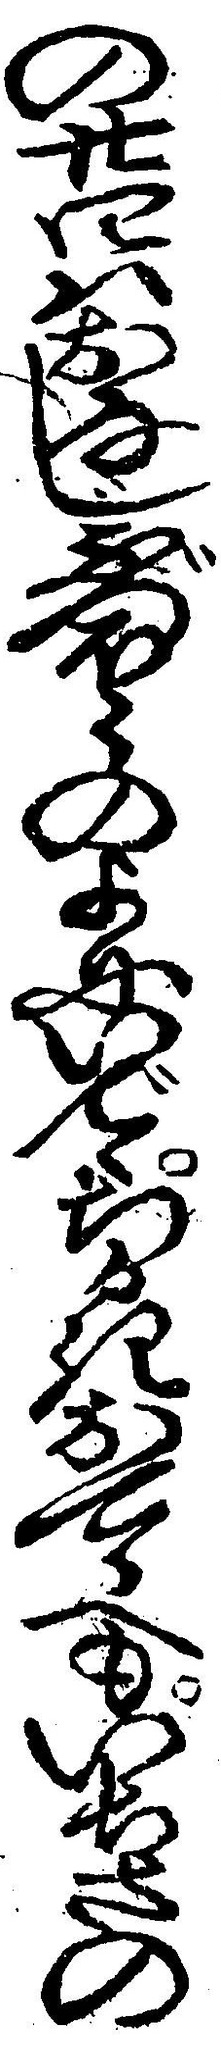の廿四はおなじぶつほうのよにいでゝ。ちかきおてらへも。いちさの
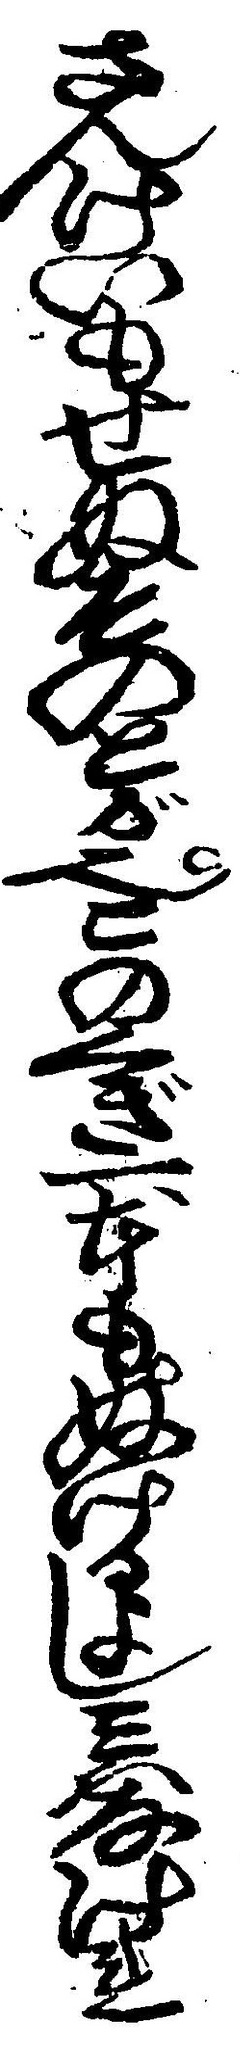さんけいもせぬそのとが也。このくぎ一本も。ぬけるよしみはなけれ
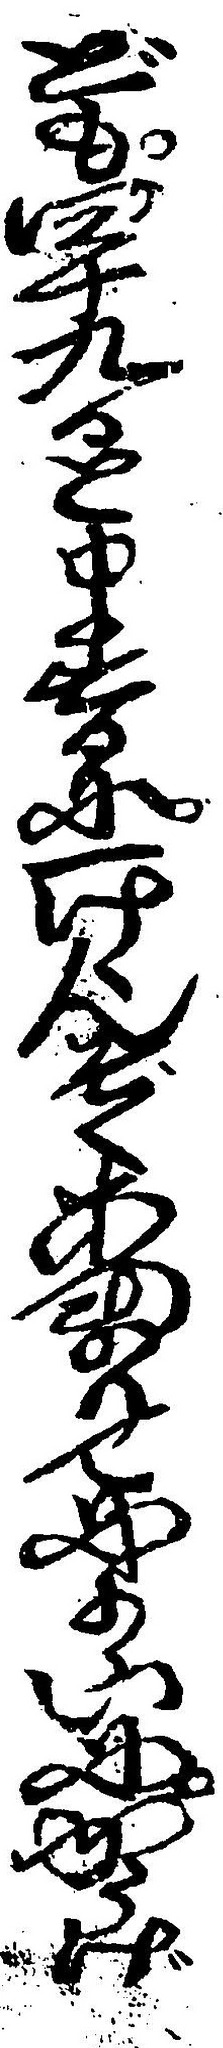ども。四十九日と申するに。一けゝんぞくあつまりてによらいに。かうげ
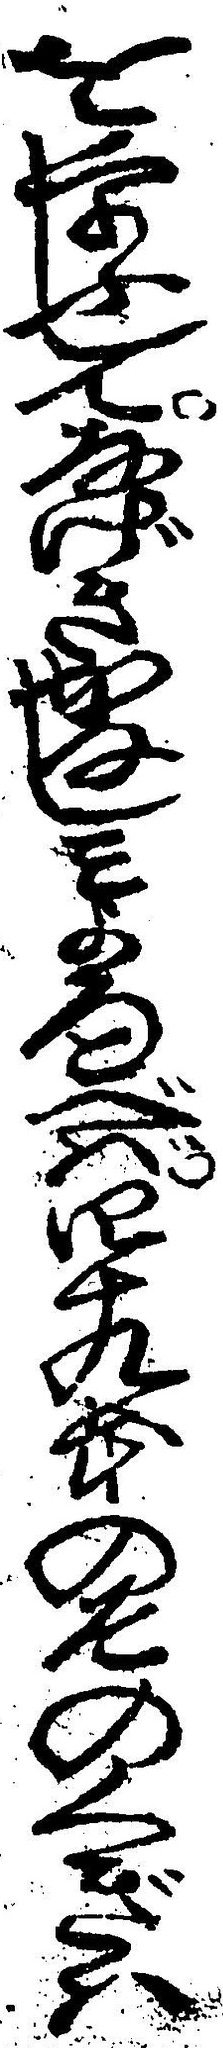をくよふして。なげきかなしみよろこべば。四十九本のそのくぎは

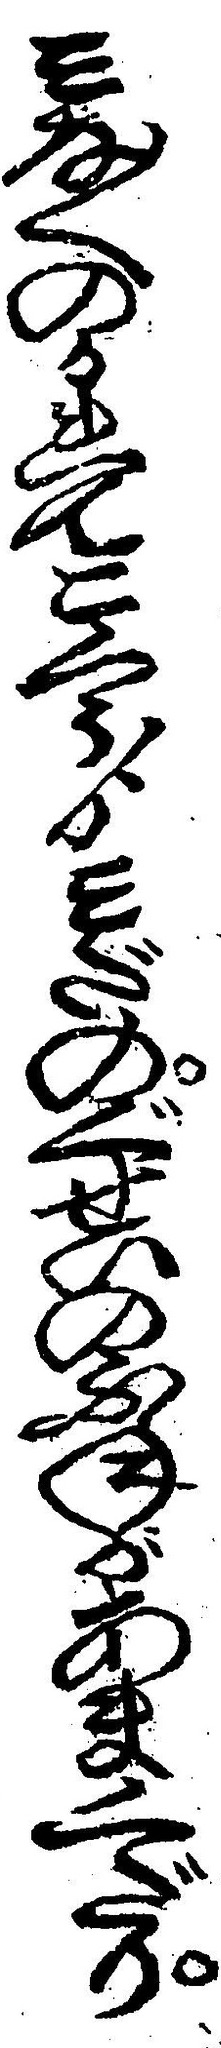みな〳〵のかれてこくうゟみだの。ぐせいのふねがあまくだり。
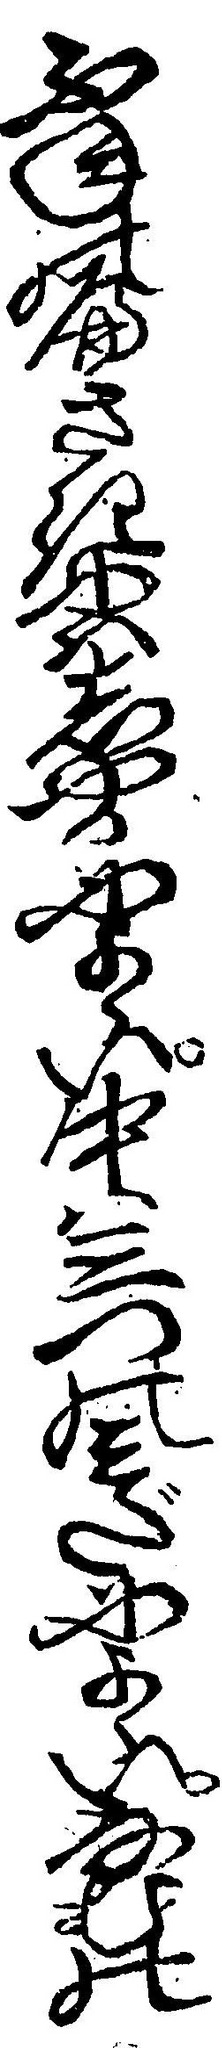ふねのへさきにはしやかによらい。中は三つのみだによらい。なむの
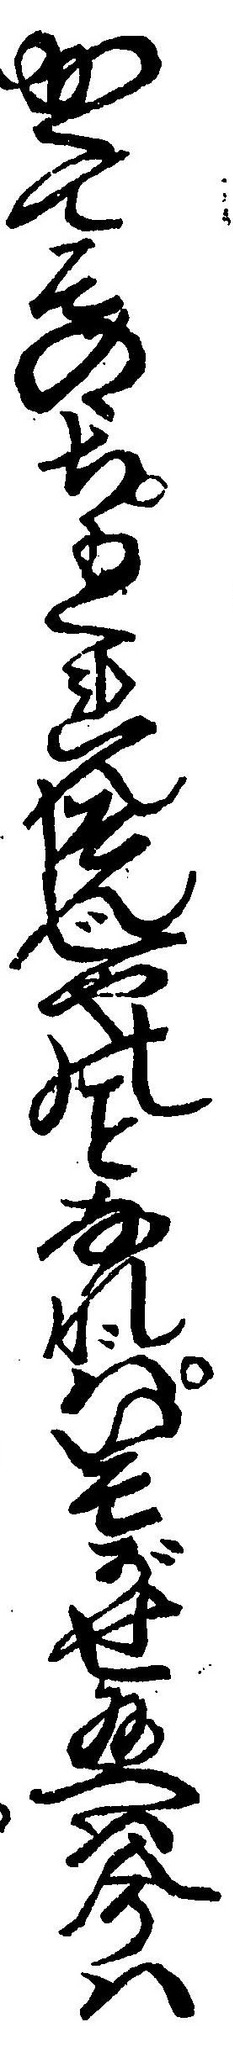かくてそのゝち。もくれんそんじやのことなれば。いそがせ給へは今は
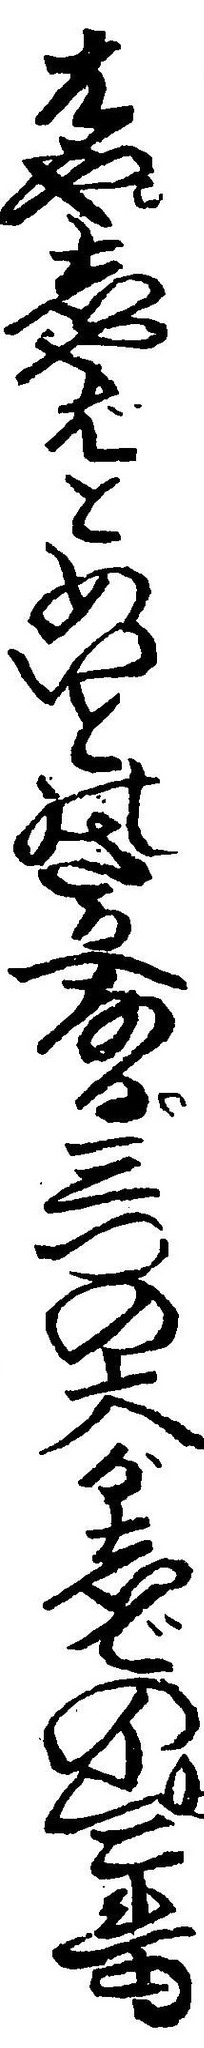はや。しやばとめいとのさかへなる。三つの大がしでの山。これも
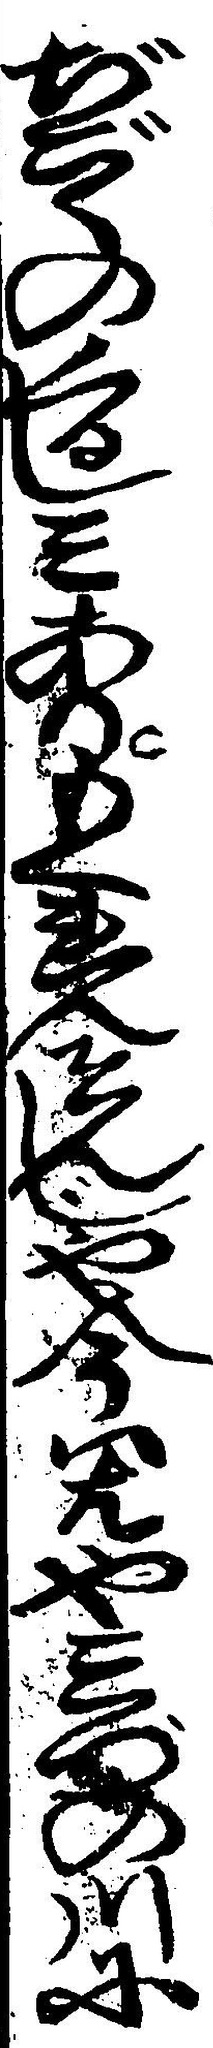ぢごくのくるしみあり。もくれんそんじや今ははやみつの川に
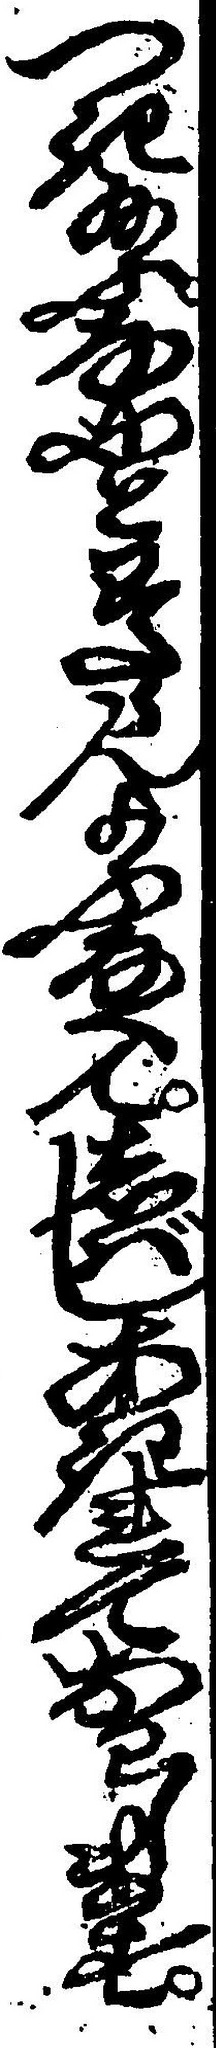つき給ふなにとわたらんよふなくて。しばしあきれておわします。
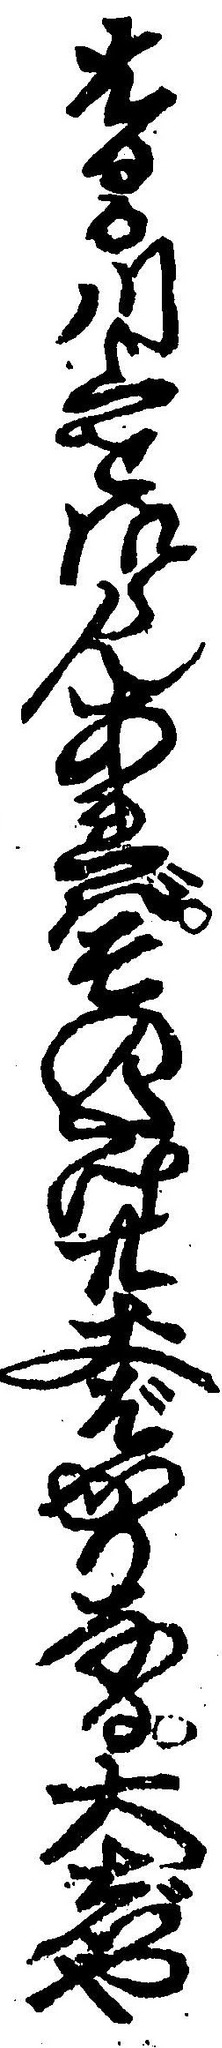はるか川上を御らんあれば。そのたけ廿丈ばかりなる。大じや
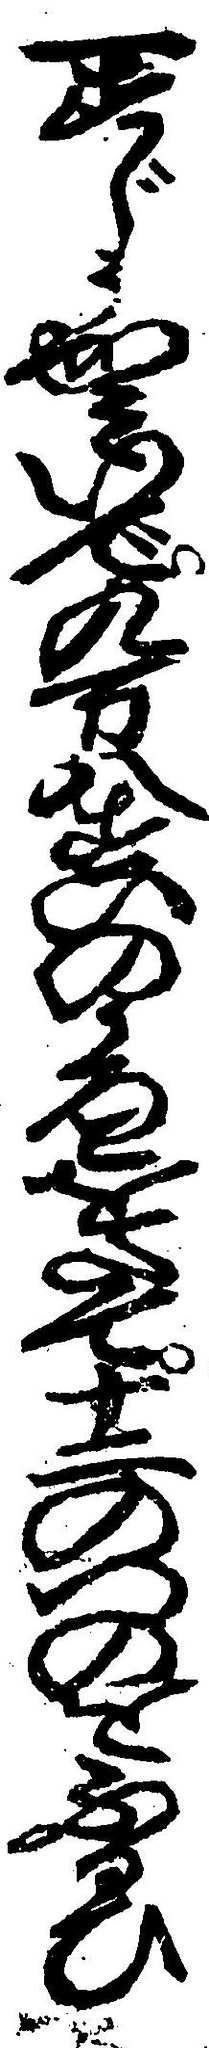一すじうかみいで。九万八すいのうろこをたて。十二のつのをふるひ
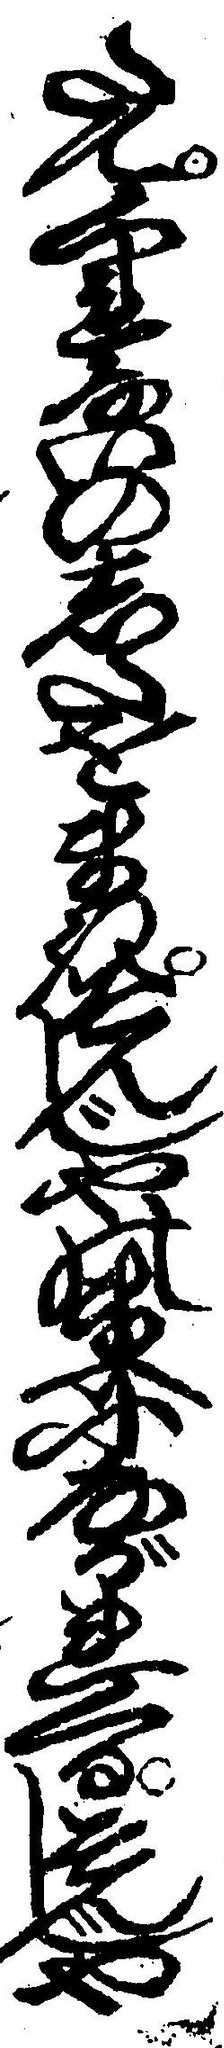たて。くれないのしたをまきそんじやのまいにながれくる。そんじや
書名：目連尊者地獄めくり / 宇留藤太夫正本
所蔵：東京大学総合図書館 General Library in the University of Tokyo, JAPAN
